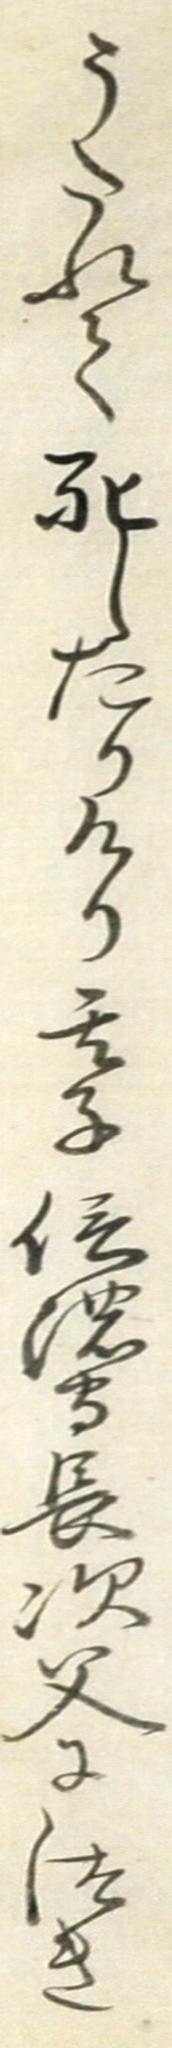うたれて死したりけり其子信濃守長次父につき
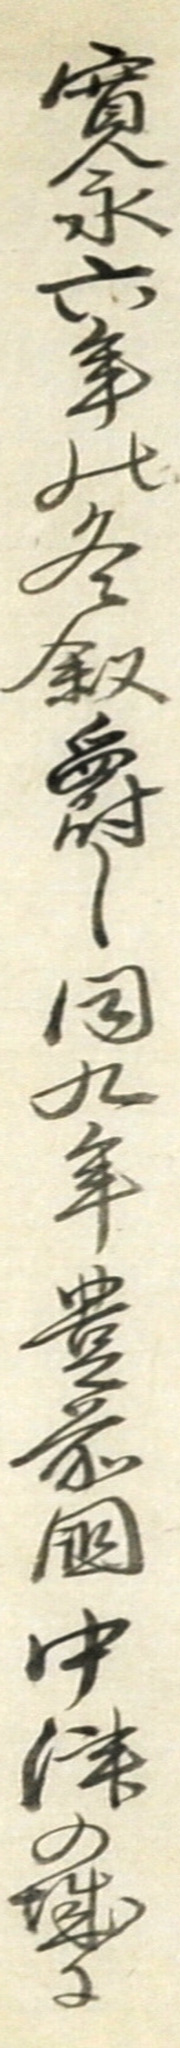寛永六年の冬叙爵し同九年豊前国中津の城に
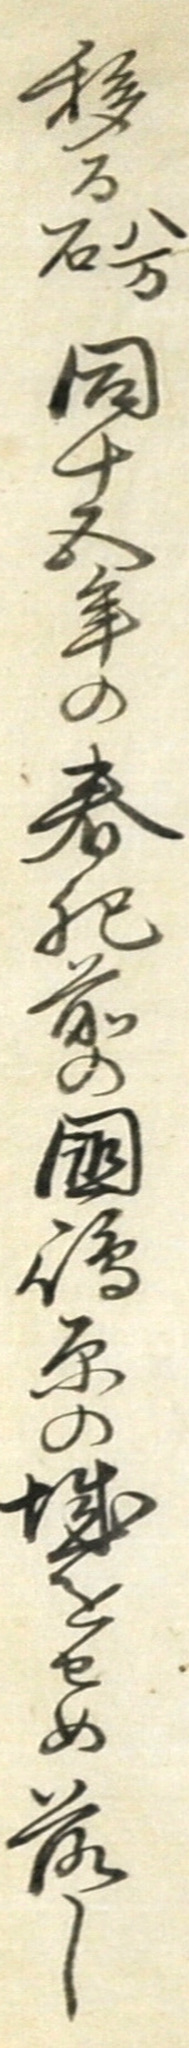移る八万石同十五年の春肥前の国島原の城をせめ落し
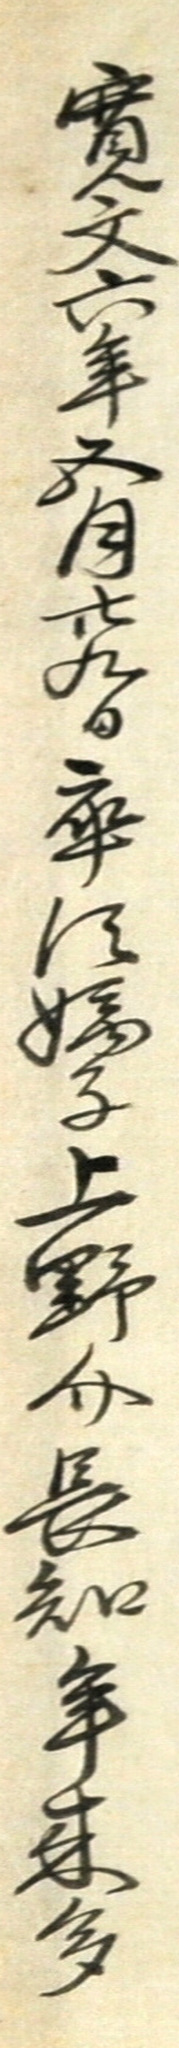寛文六年五月廿九日卒す嫡子上野介長知年来多

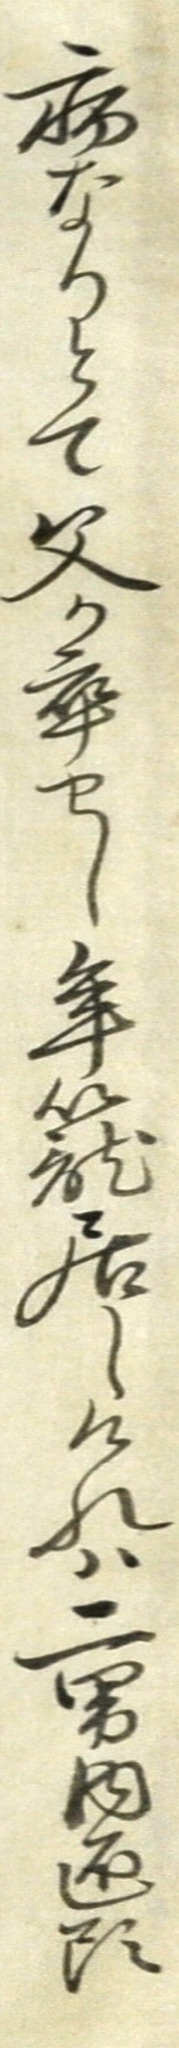病なりとて父か卒せし年籠居しけれは二男内匠頭
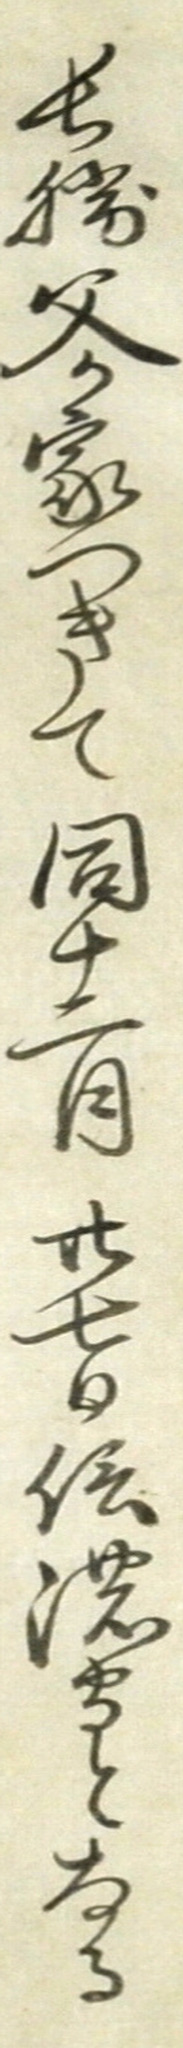長勝父か家つきて同十二月廿七日信濃守となる
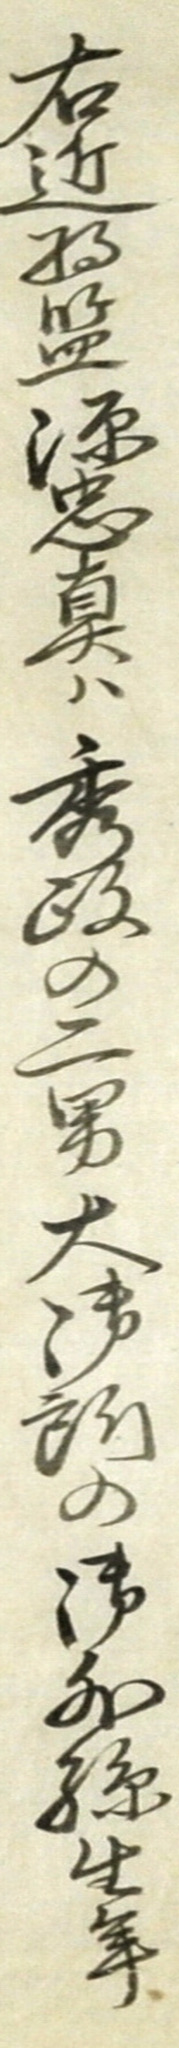右近将監源忠真は秀政の二男大御所の御外孫生年
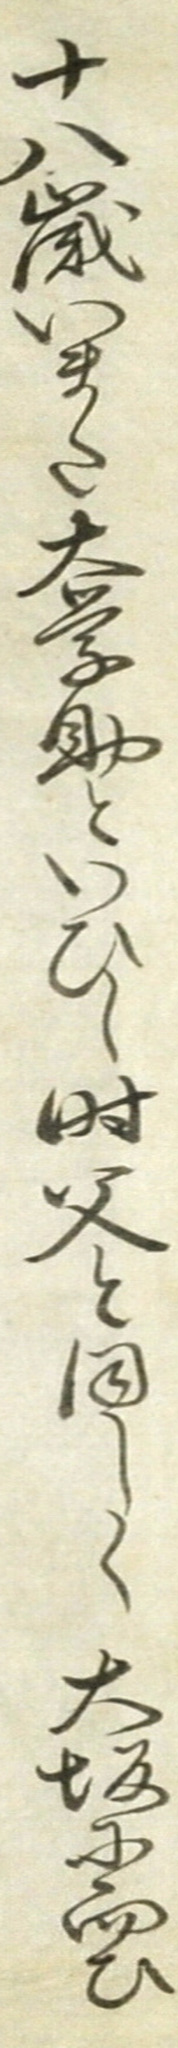十八歳いまた大学助といひし時父と同しく大坂に向ひ
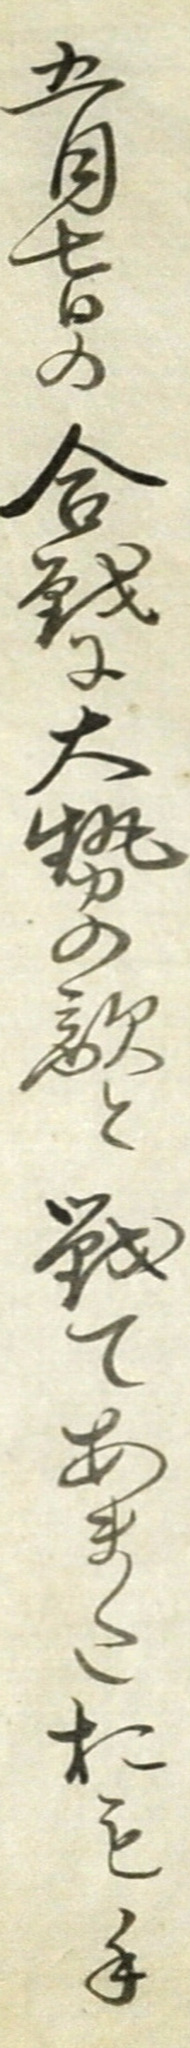五月七日の合戦に大勢の敵と戦てあまたおも手
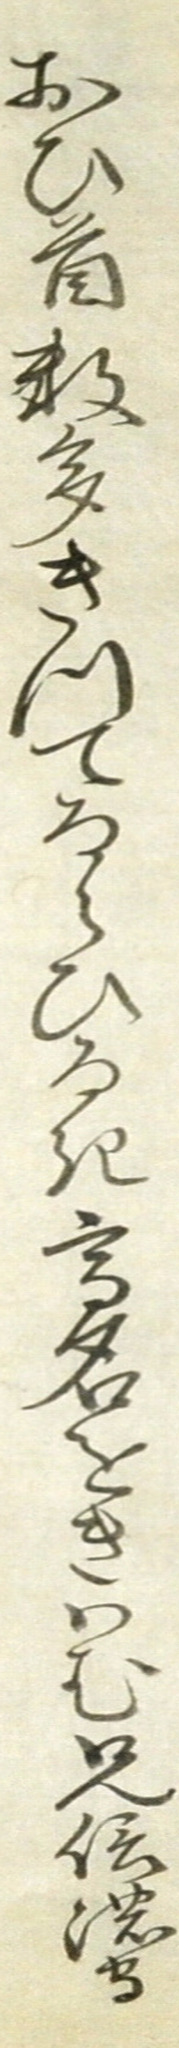おひ首数多きつてならひなき高名をきはむ兄信濃守
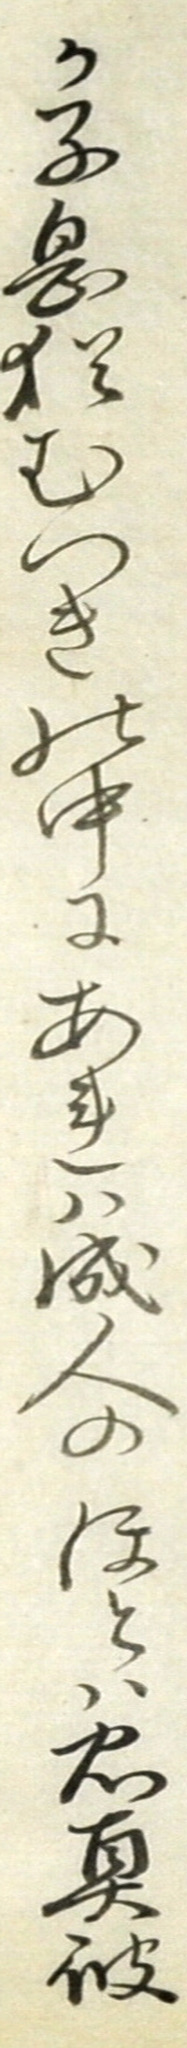か子息猶むつきの中にあれは成人のほとは忠真彼
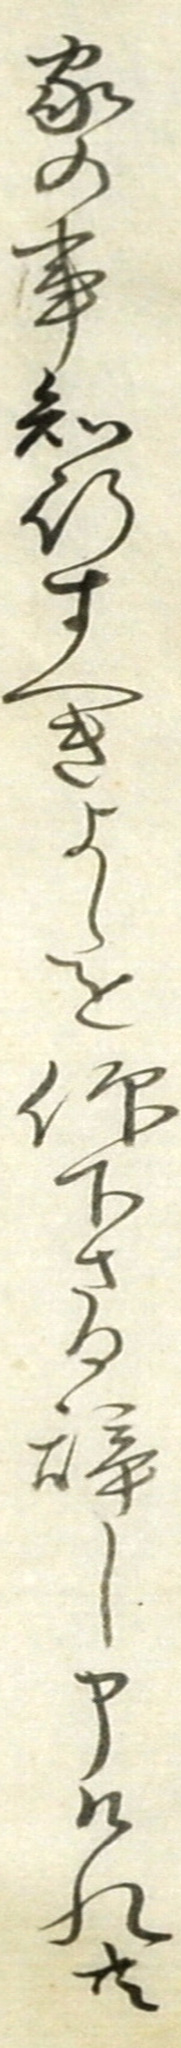家の事知行すへきよしを仰下さるは辞し申けれ共
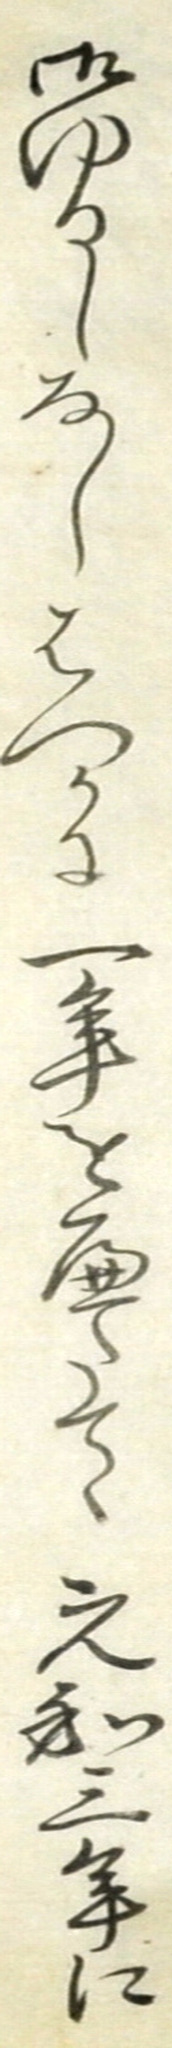御ゆるしなしはつかに一年をへたてゝ元和三年に
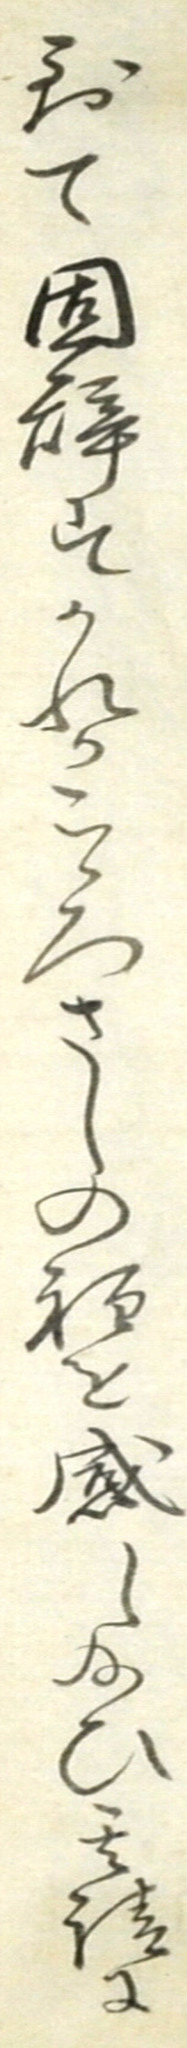到て固辞すかれかこゝろさしの程を感し給ひ其請に
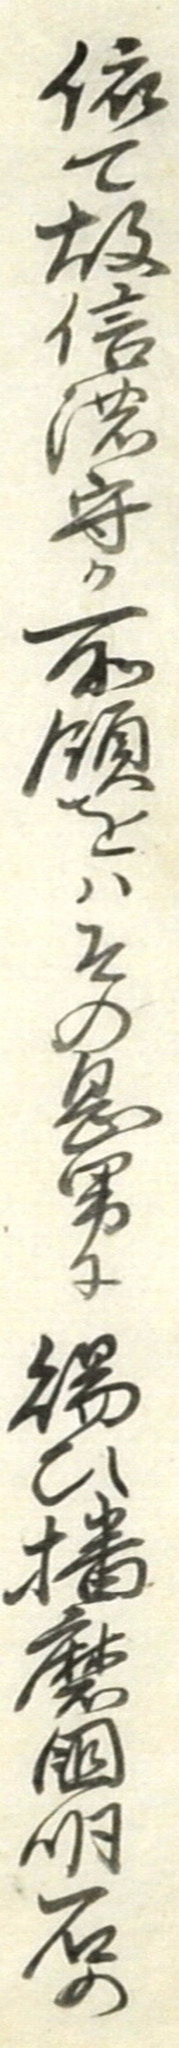依て故信濃守か所領をはその息男に賜ひ播磨国明石の
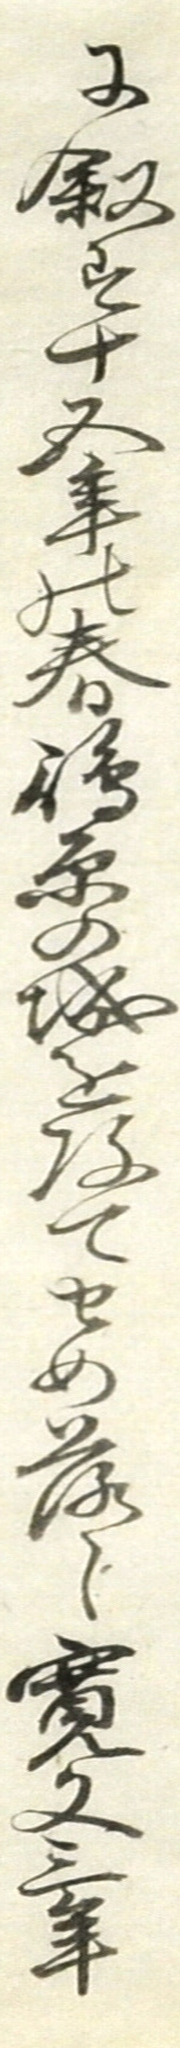に叙す十五年の春島原の城を攻てせめ落し寛文三年
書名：藩翰譜（六）
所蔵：伊那市立高遠町図書館・合同会社AMANE
